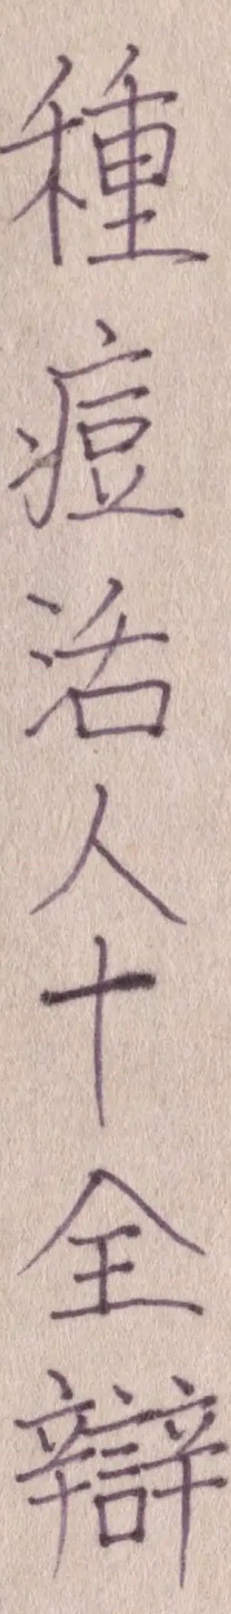種痘活人十全弁

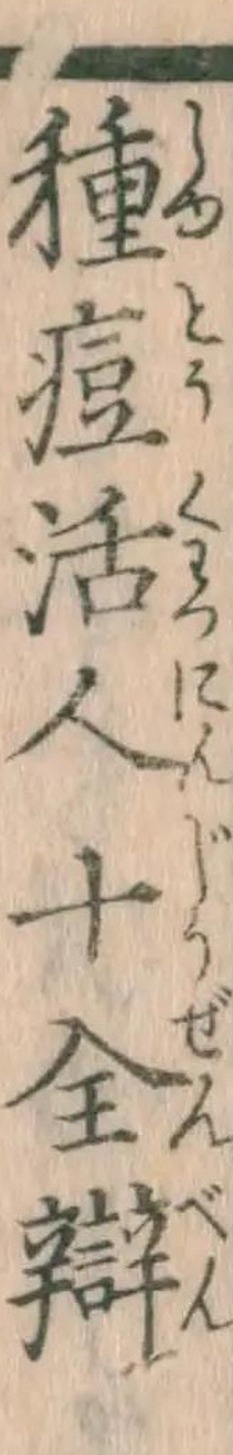種痘活人十全弁
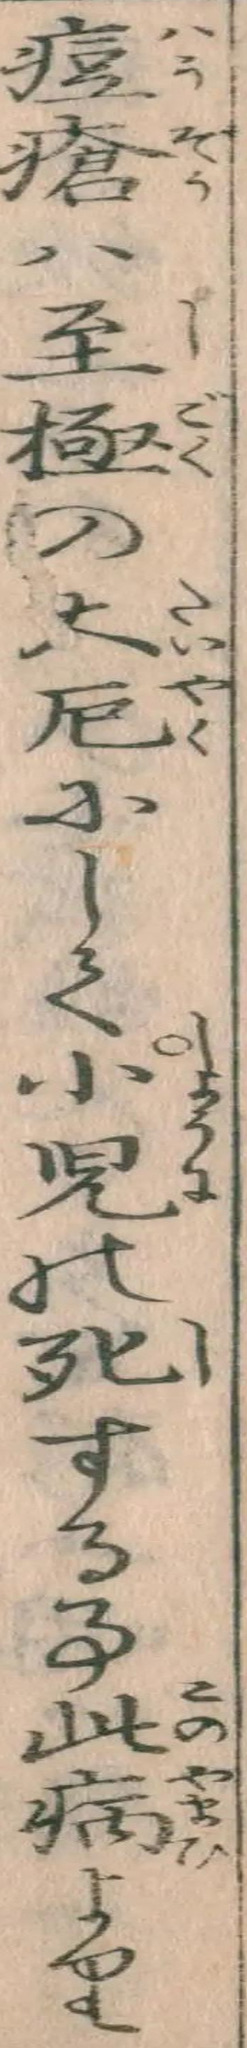痘瘡は至極の大厄にして。小児の死する事此病より
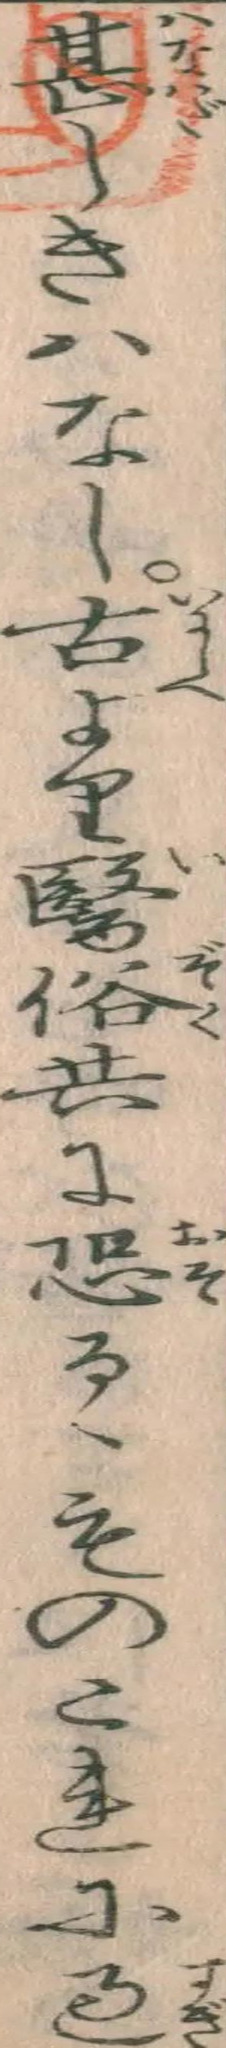甚しきはなし。古より医俗共に恐るゝものこれに過
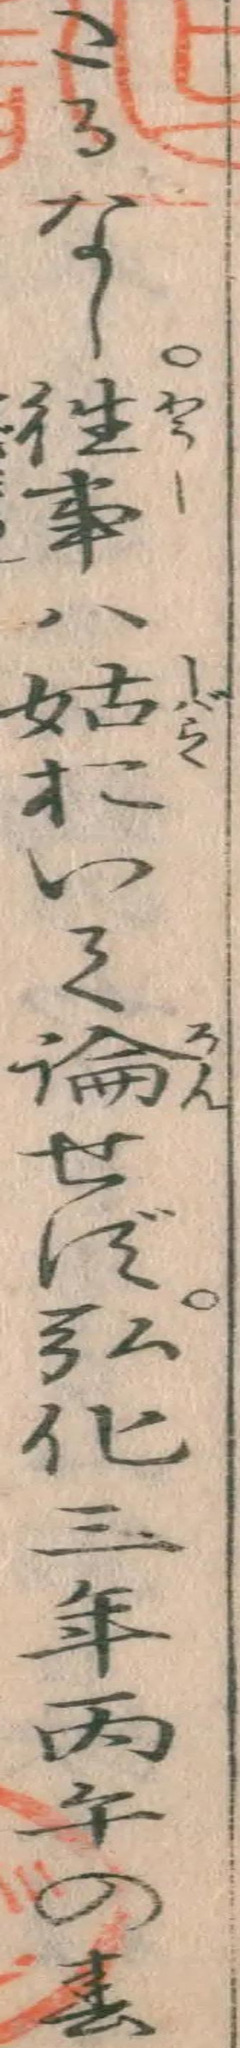たるなし。往事は姑おいて論せず。弘化三年丙午の春
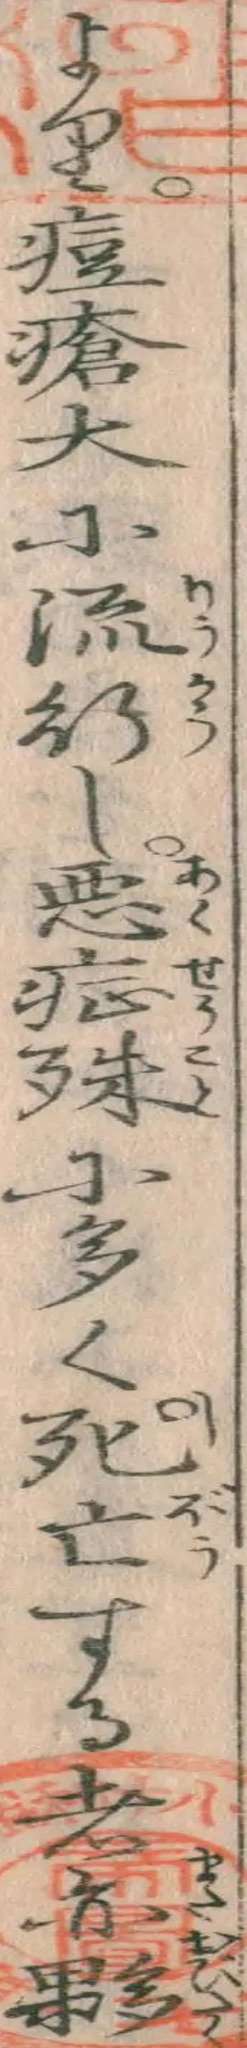より。痘瘡大に流行し。悪症殊に多く。死亡する者亦夥
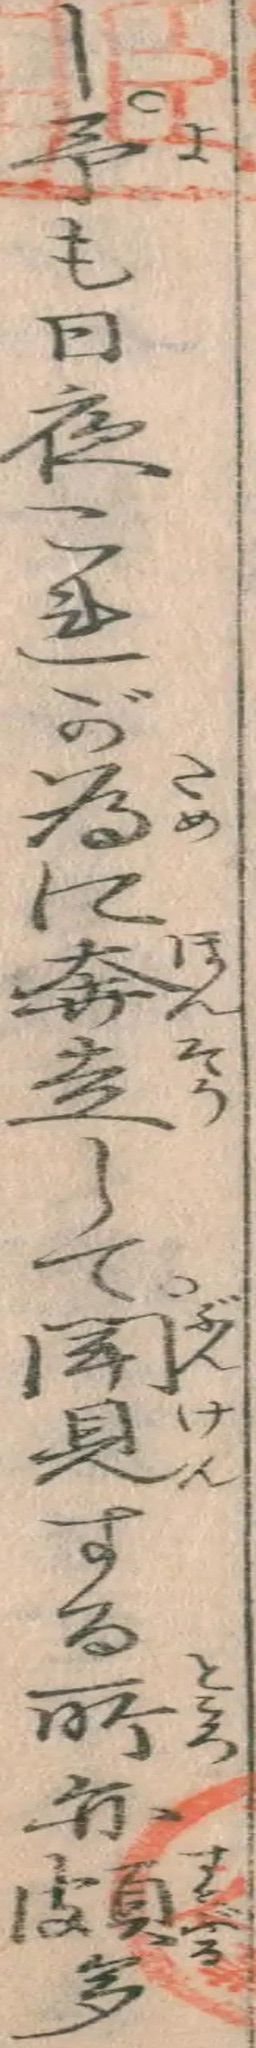し。予も日夜これが為に奔走して。聞見する所亦頗多
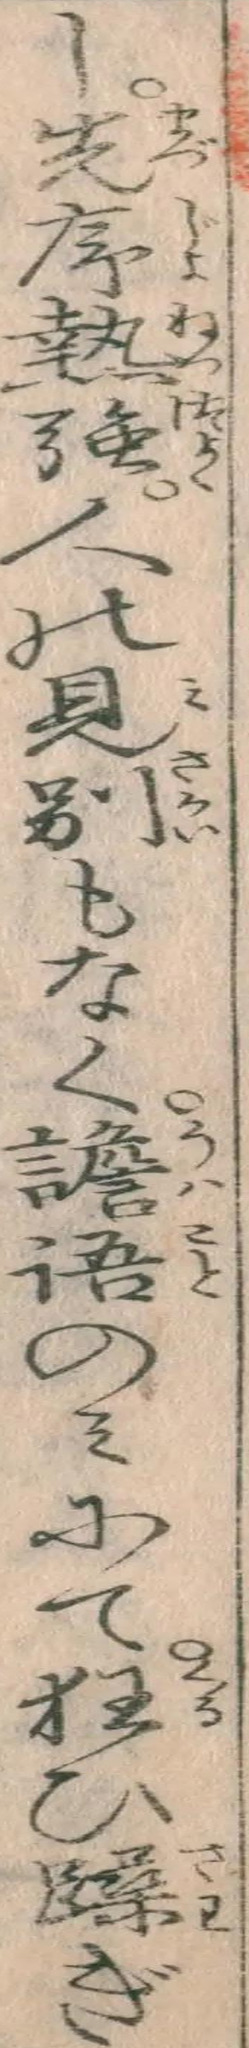し。先序熱強。人の見別もなく。譫語のみにて。狂ひ躁ぎ
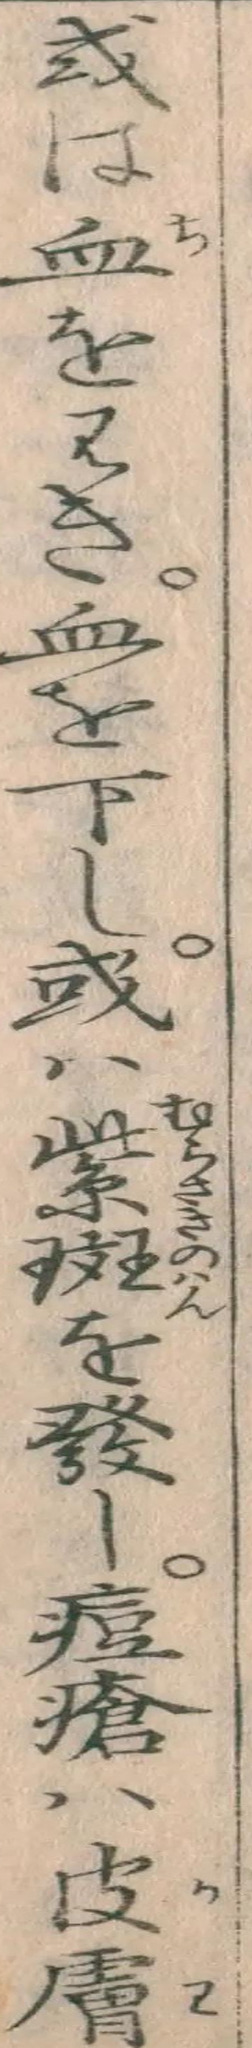或は血をはき。血を下し。或は紫斑を発し。痘瘡は皮膚
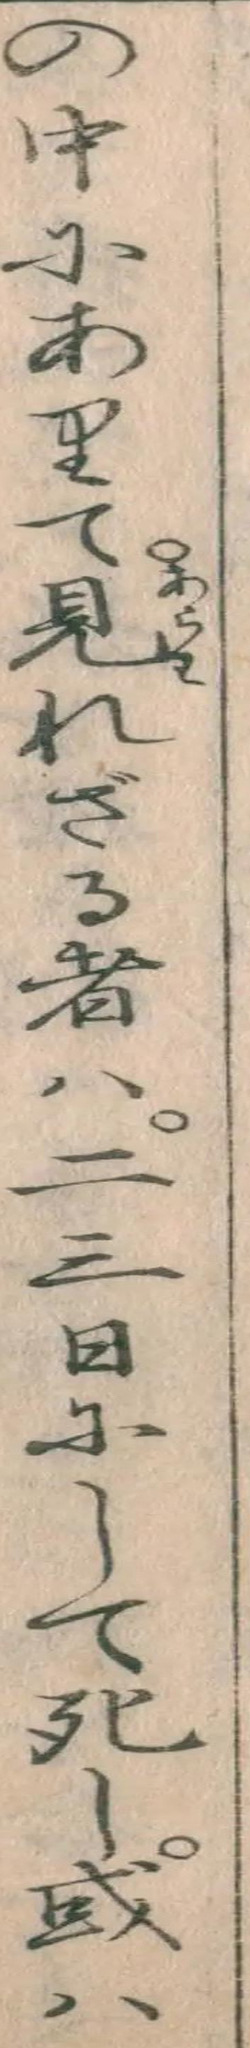の中にありて。見れざる者は。二三日にして死し。或は
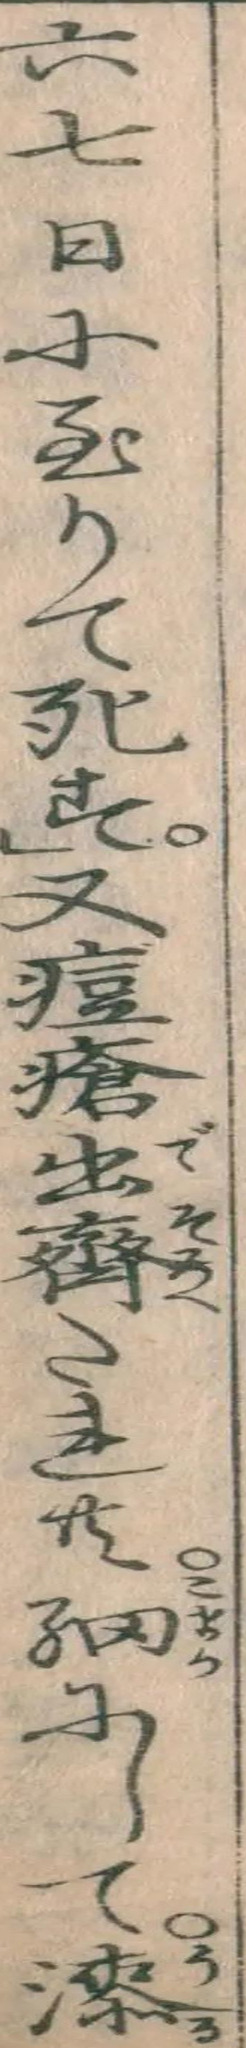六七日に至りて死す。」又痘瘡出斉たれ共。細にして。漆

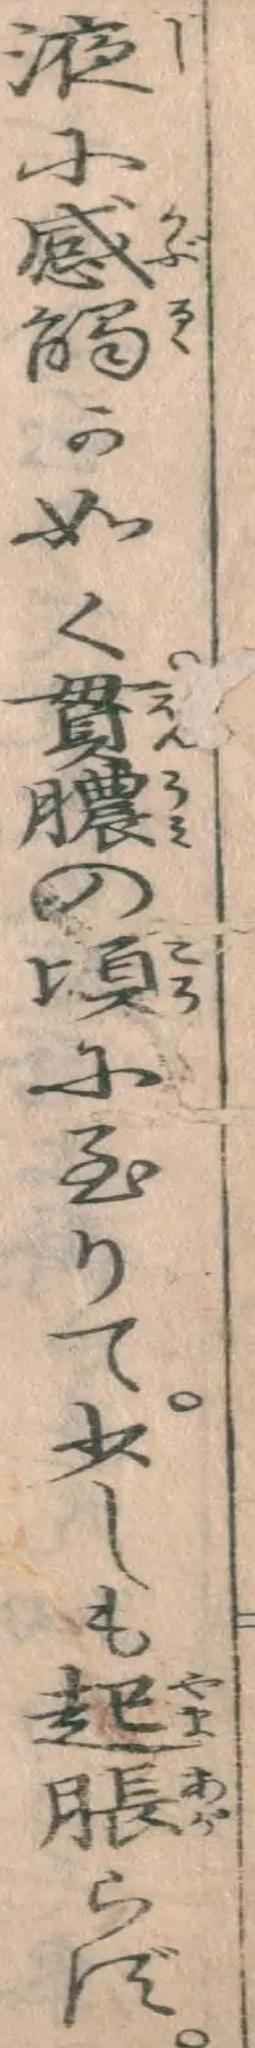液に感触か如く。貫膿の頃に至りて。少しも起脹らず。
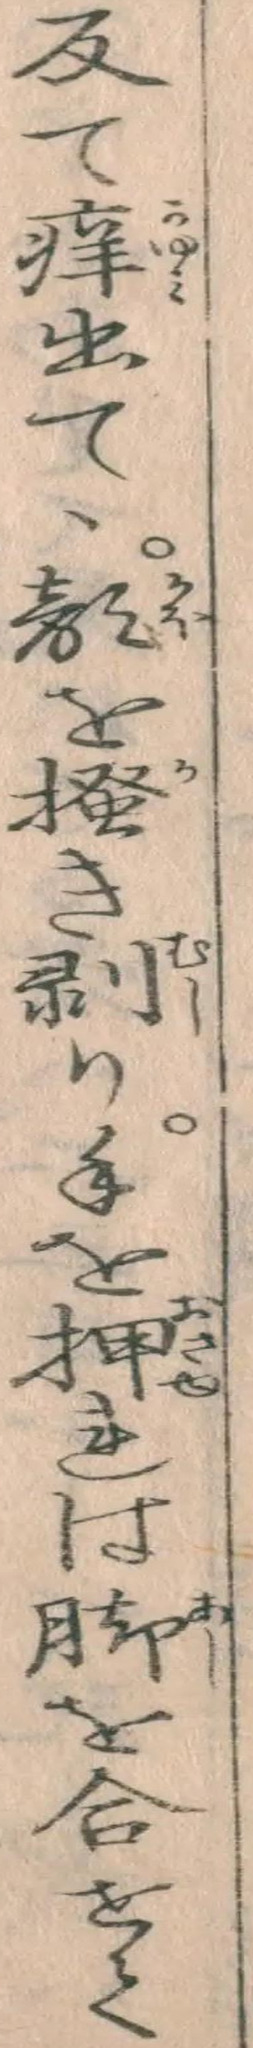反て痒出てゝ。顔を掻き剥り。手を押れは脚を合せて
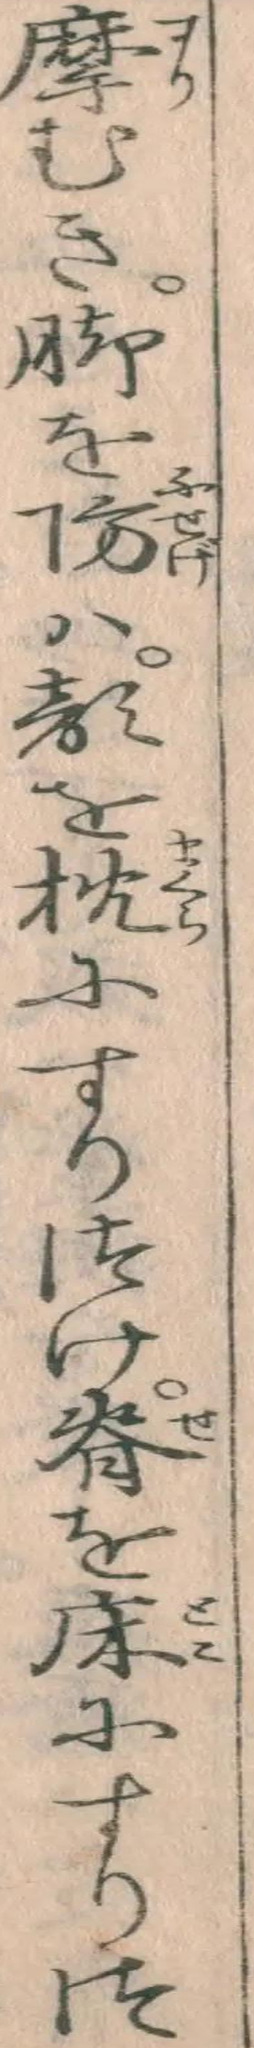摩むき。脚を防は。顔を枕にすりつけ。背を床にすりつ
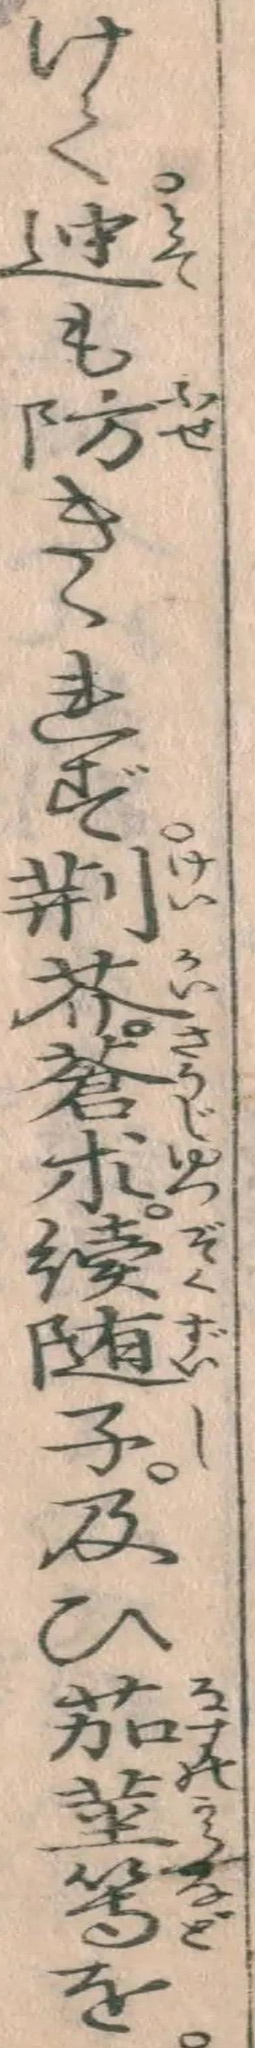けて。迚も防きゝれず。荊芥。蒼朮。続随子。及ひ茄茎等を。
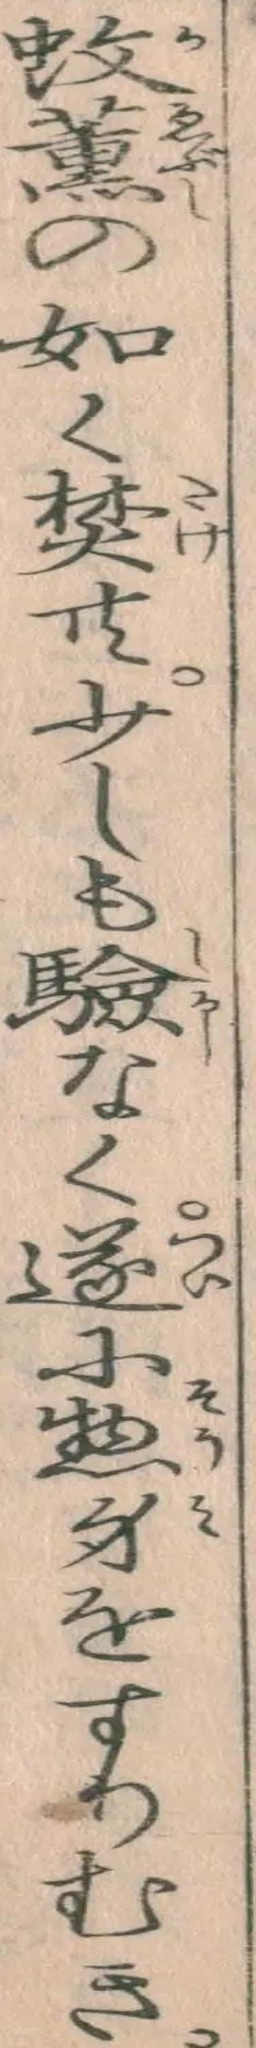蚊薫の如く焚共。少しも験なく。遂に惣身をすりむき。
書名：種痘活人十全辯
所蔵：国立国会図書館 National Diet Library, JAPAN
